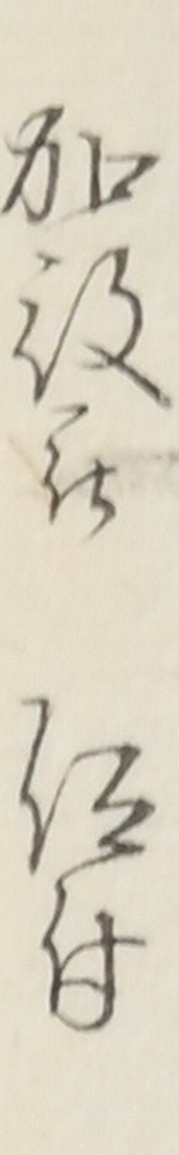加役被仰付

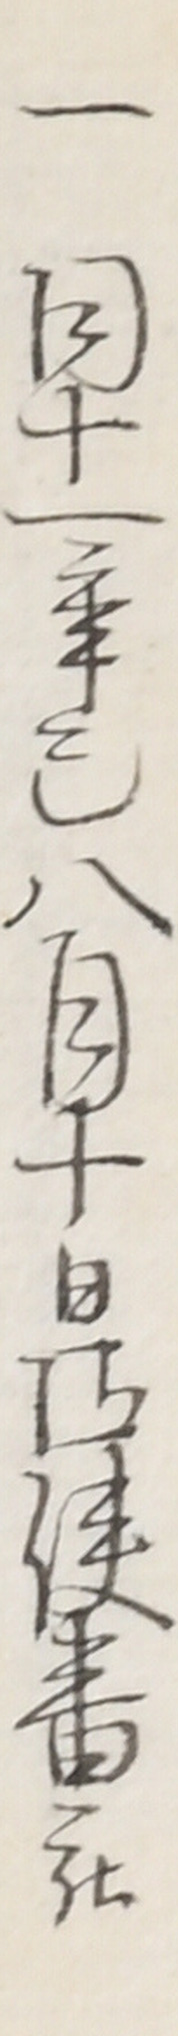一同十一辛巳八月十日御使番被
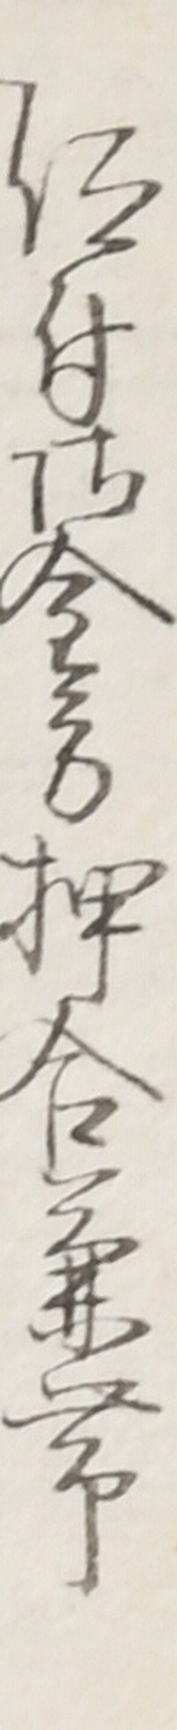仰付御金方押合兼帯
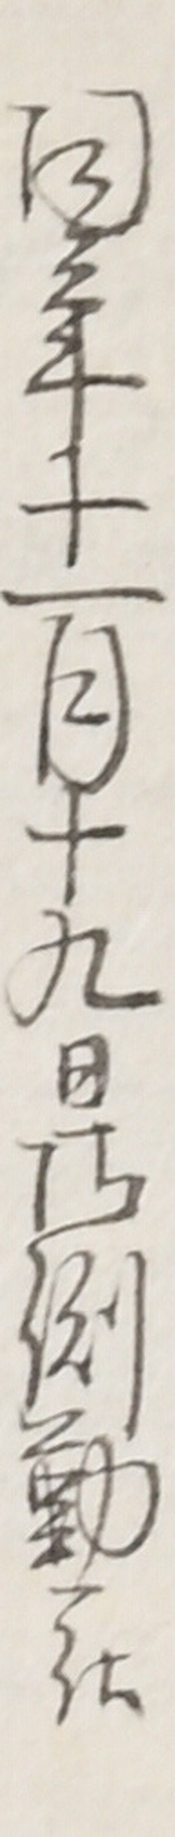一同年十一月十九日御側勤被
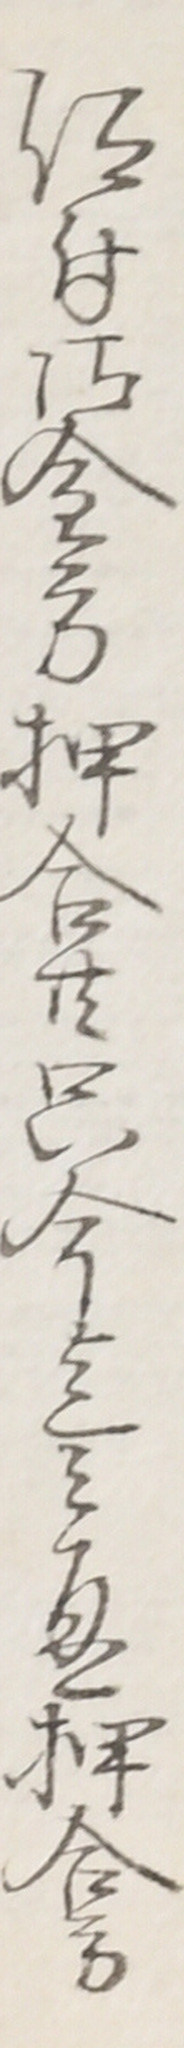仰付御金方押合共只今迄之通押合方
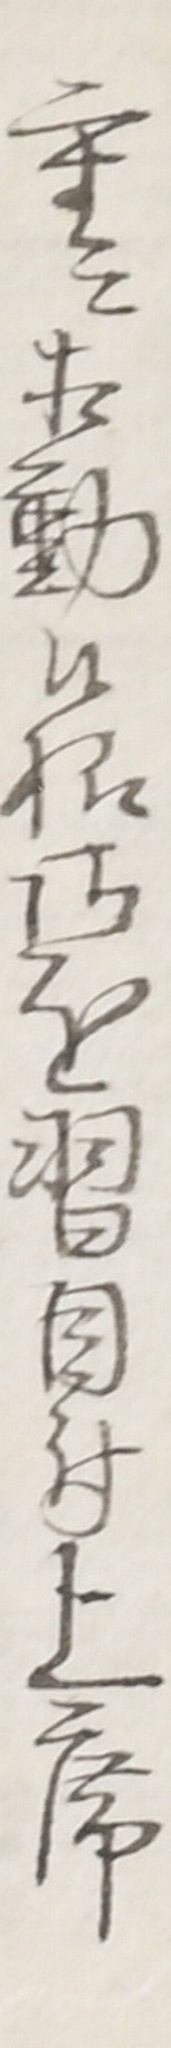重ニ相勤候様御近習目付上席
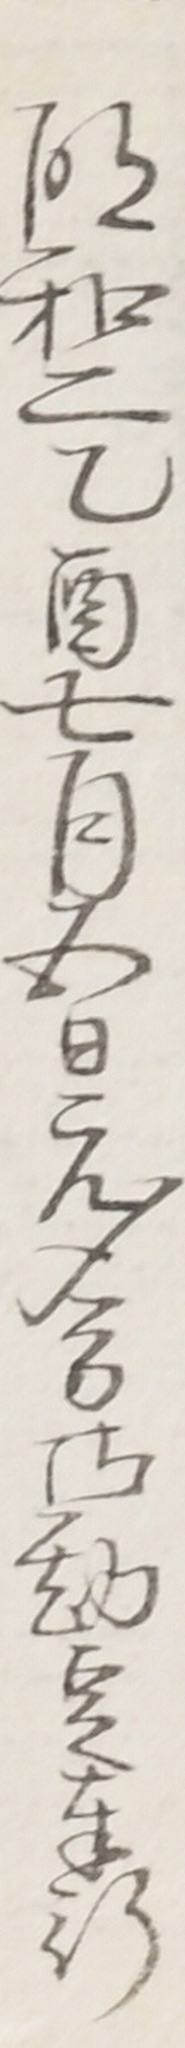一明和二乙酉七月五日元〆方御勘定奉行
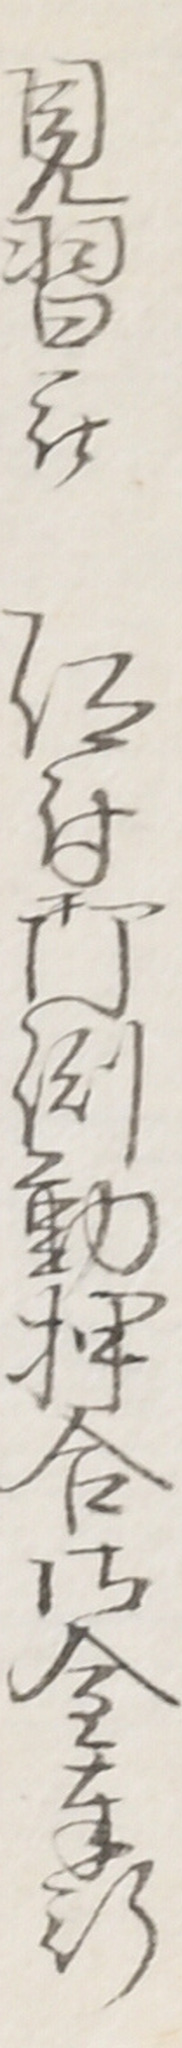見習被仰付御側勤押合御金奉行
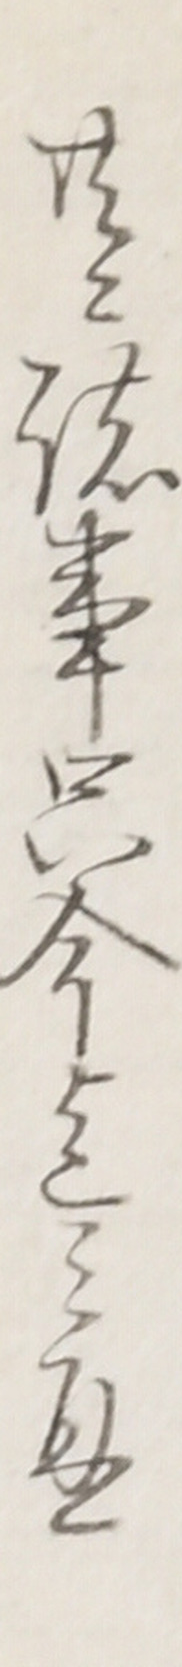共ニ諸事只今迄之通
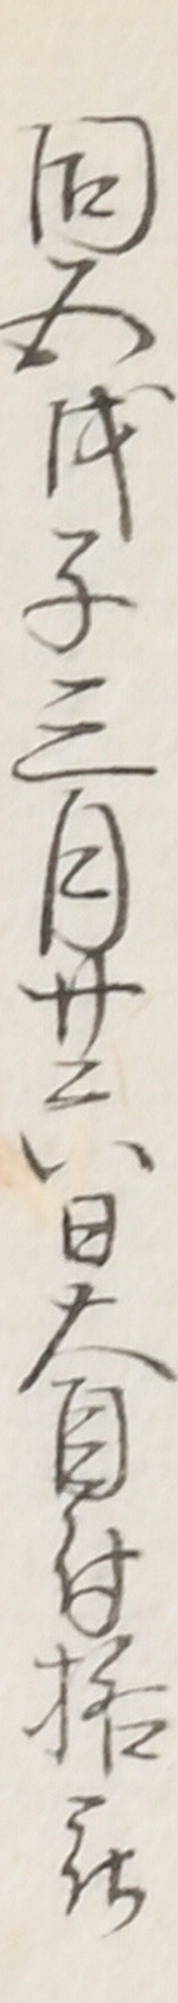一同五戊子三月廿六日大目付格被
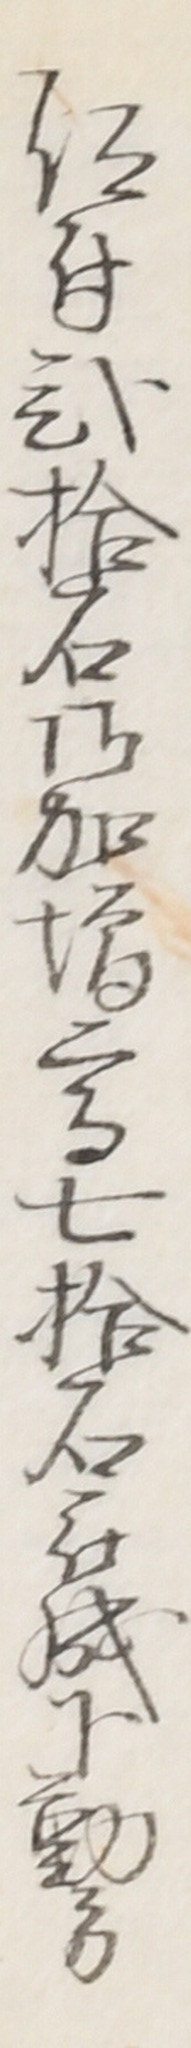仰付弐拾石御加増高七拾石被成下勤方
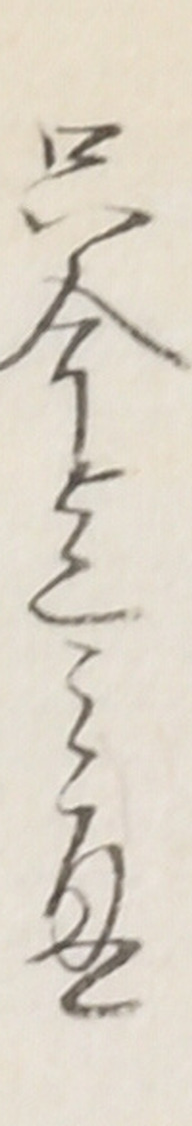只今迄之通
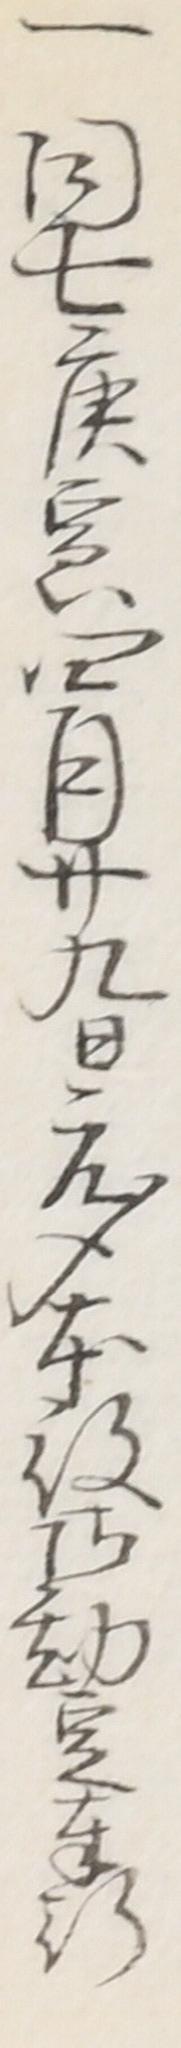一同七庚寅四月廿九日元〆本役御勘定奉行
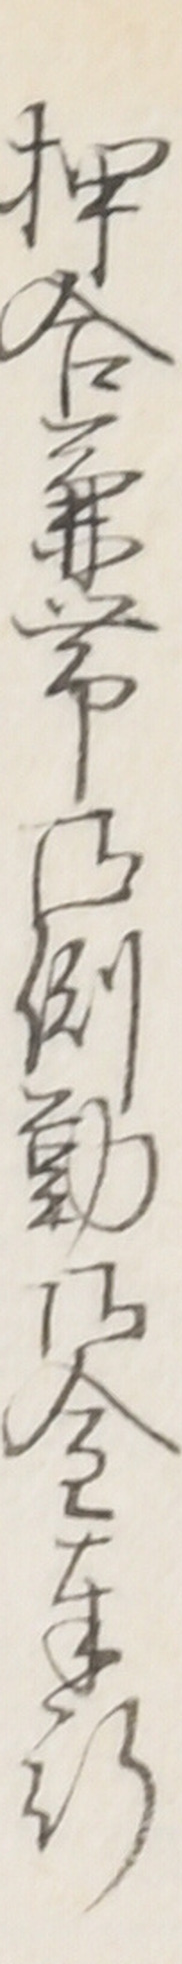押合兼帯御側勤御金奉行
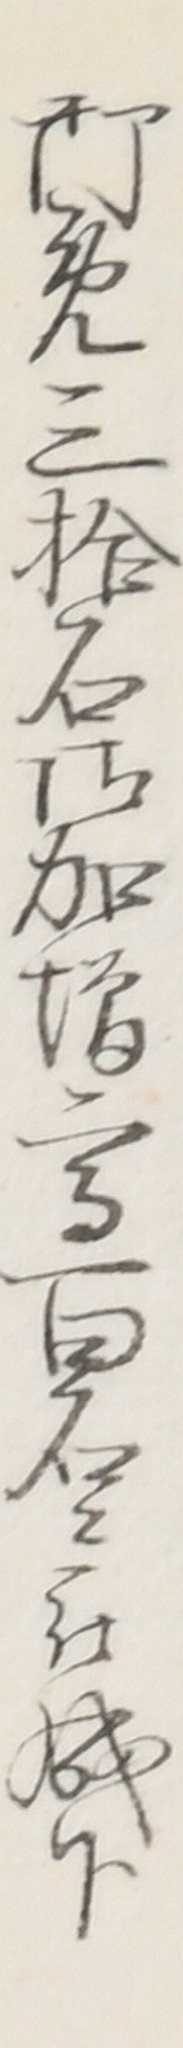御免三拾石御加増高百石ニ付成下
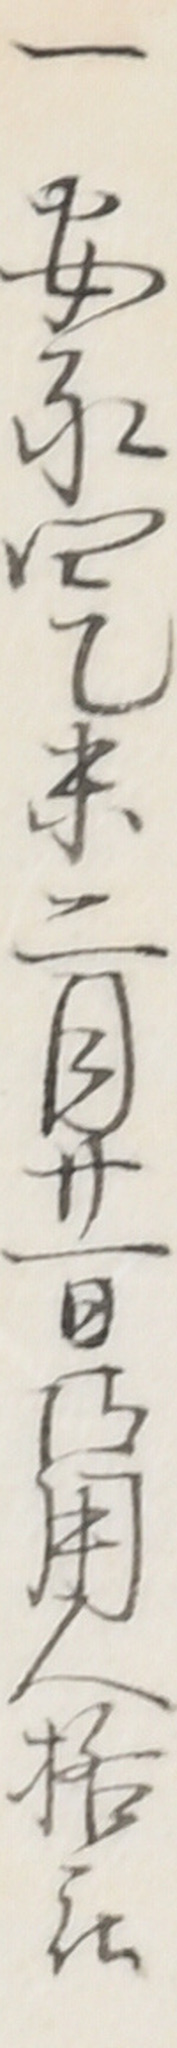一安永四乙未二月廿一日御用人格被
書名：給人諸士勤仕録（七）
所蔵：伊那市立高遠町図書館・合同会社AMANE
